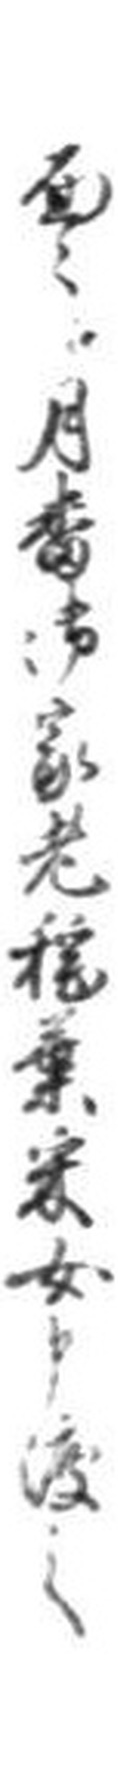面々江月番御家老稲葉采女申渡之
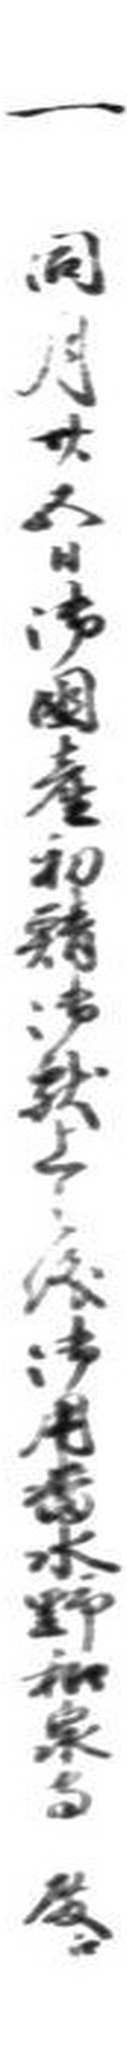一同月廿五日御国産初鯖御献上之儀御用番水野和泉守殿江
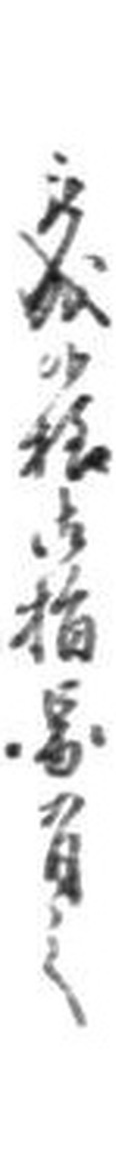被成候様御指図有之
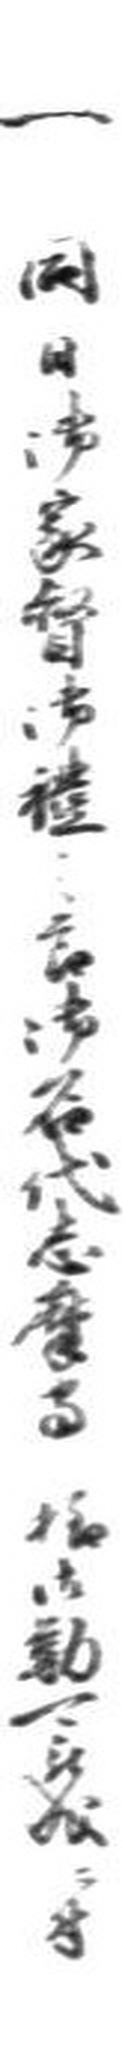一同日御家督御礼之節御名代志摩守様御勤可被成ニ付
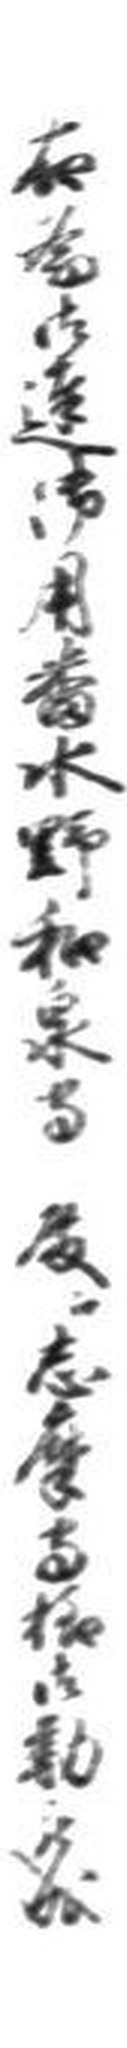右為御達御用番水野和泉守殿江志摩守様御勤被成
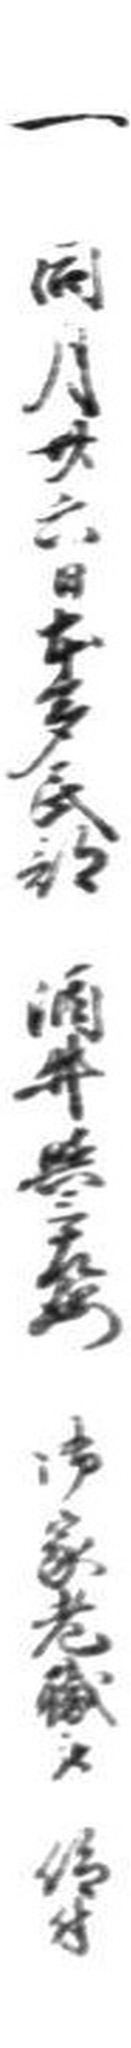一同月廿六日本多民部酒井与三左衛門御家老職被仰付
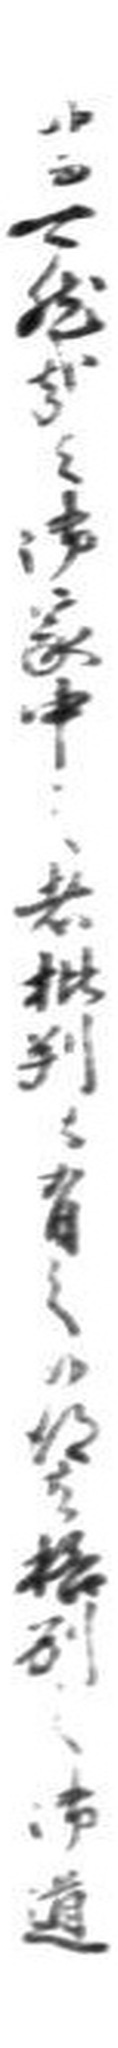候而可然哉与御家中之者批判も有之候得共格別之御道

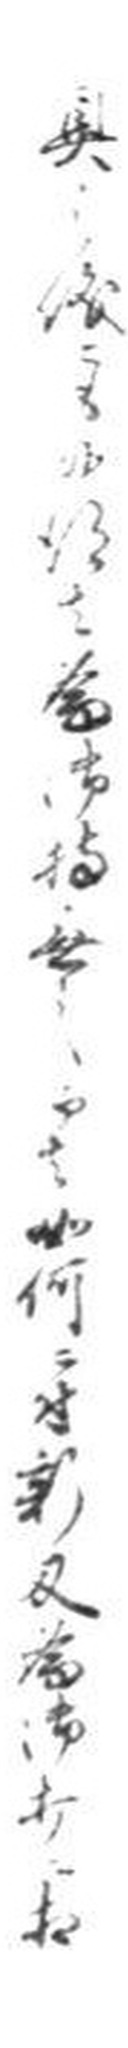具之儀ニ而候得者為御持無之而者如何ニ付新刃為御打ニ相
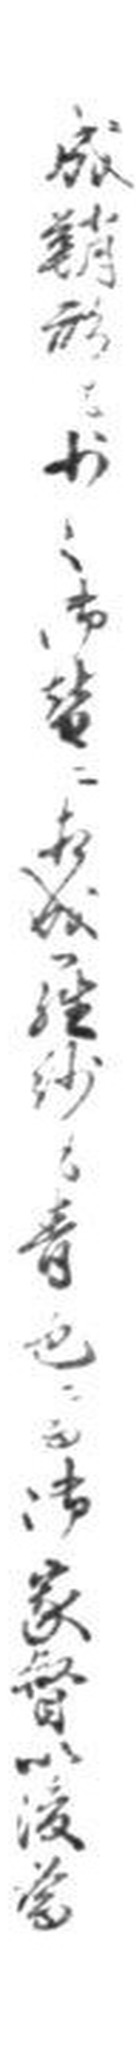成鞘形も少々御替ニ相成羅紗も青色ニ而御家督以後為
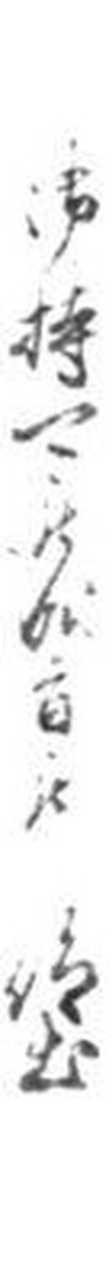御持可被成旨被仰出
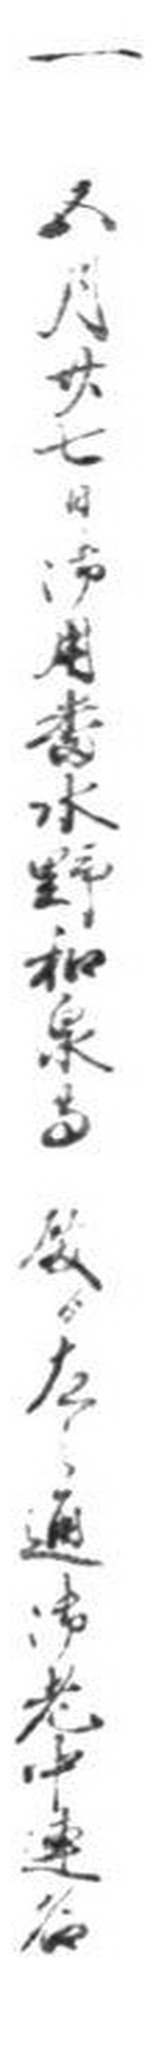一五月廿七日御用番水野和泉守殿江左之通御老中連名
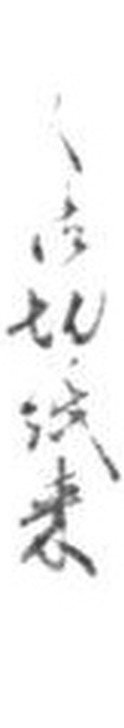之御切紙来
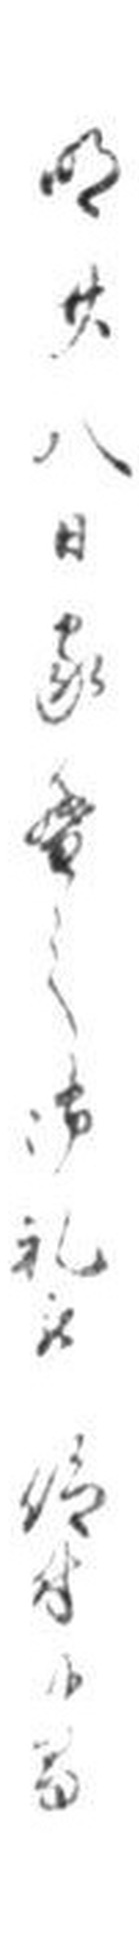明廿八日家督之御礼被仰付候間
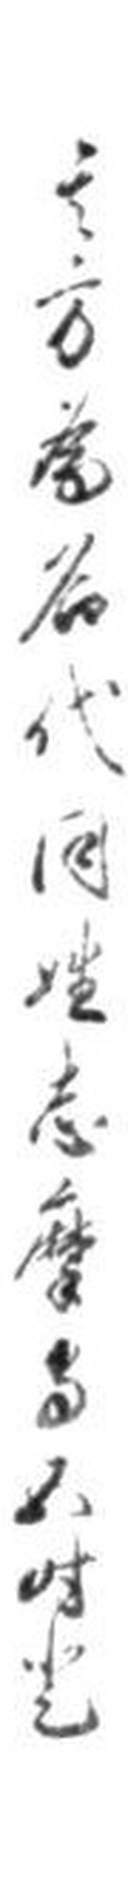其方為名代同姓志摩守五時登
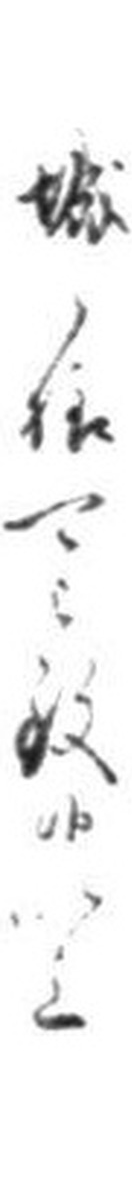城候様可被致候以上
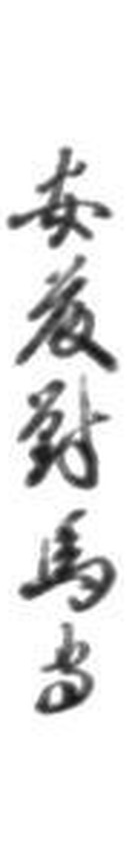安藤対馬守
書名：家譜 三十八 宗矩公 従享保九年五月到享保九年十二月
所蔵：福井県文書館 Fukui Prefectural Archives
